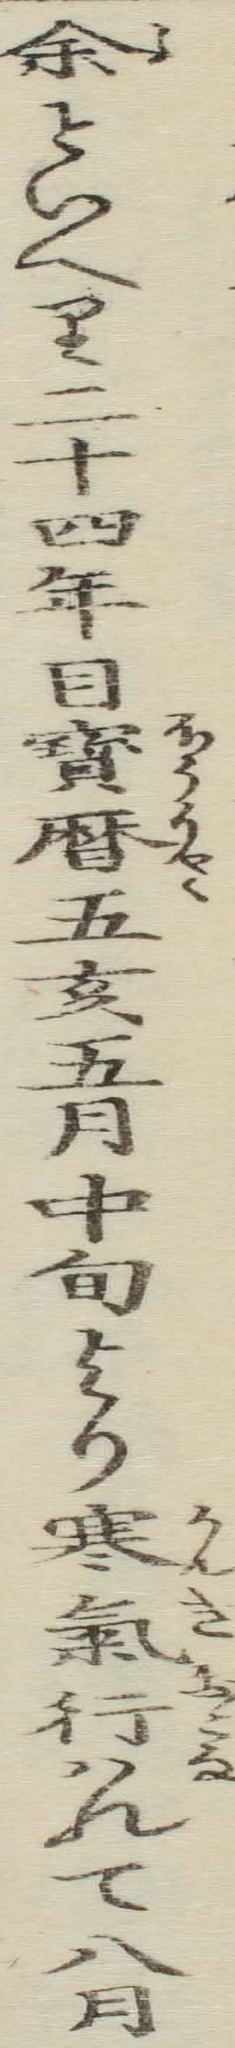余といへり二十四年目宝暦五亥五月中旬より寒気行はれて八月
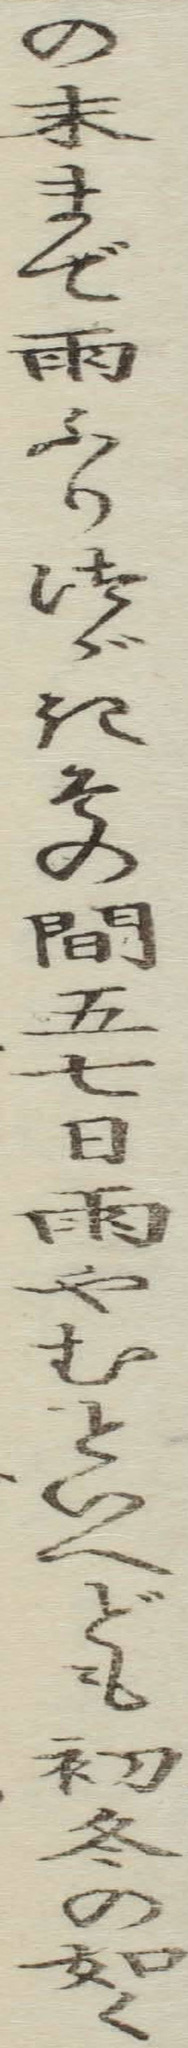の末まで雨ふりつゞきその間五七日雨やむといへども初冬の如く
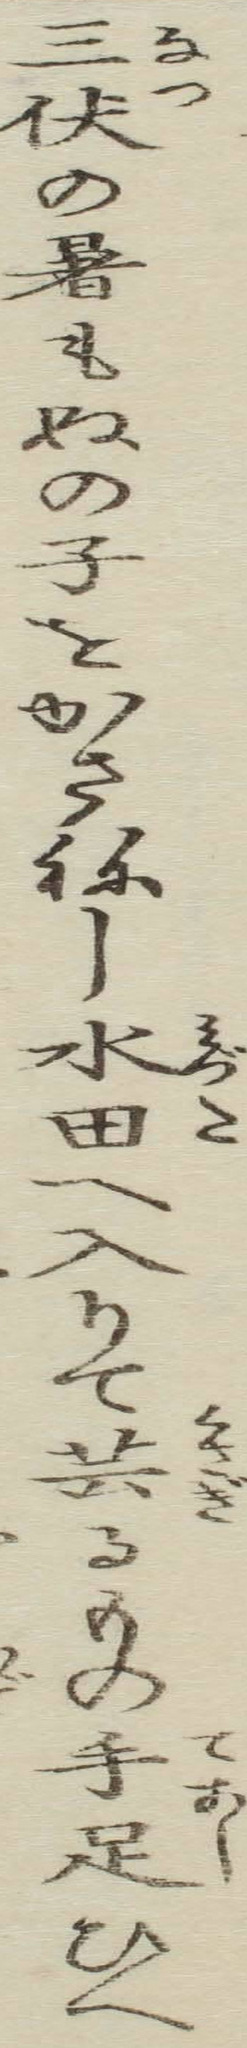三伏の暑もぬの子をかさねし水田へ入りて芸るもの手足ひへ
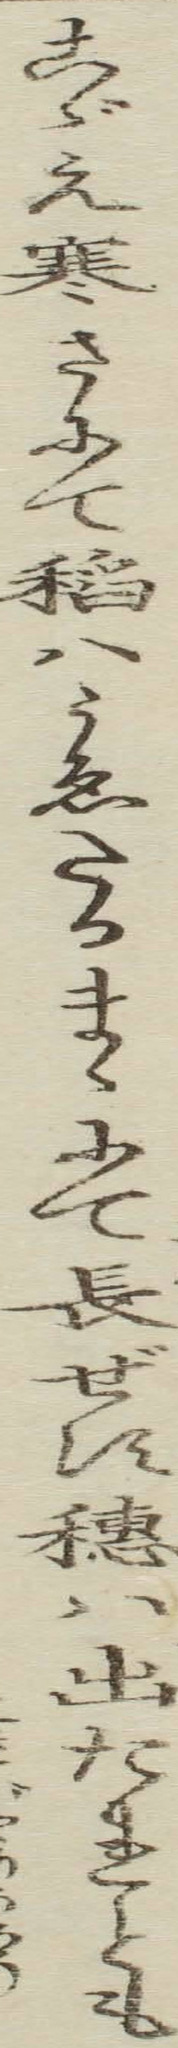こゞえ寒さにて稲はうゑたるまゝにて長ぜす穂は出たれとも
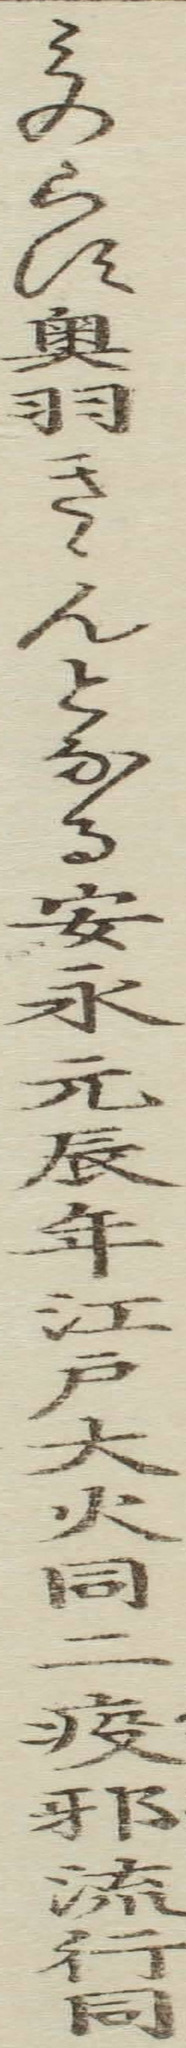みのらす奥羽きゝんとなる安永元辰年江戸大火同二疫邪流行同
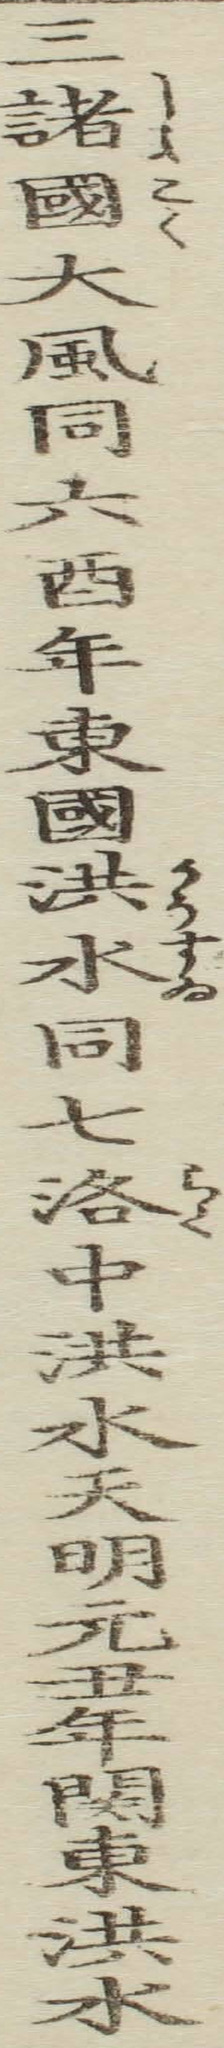三諸国大風同六酉年東国洪水同七洛中洪水天明元丑年関東洪水
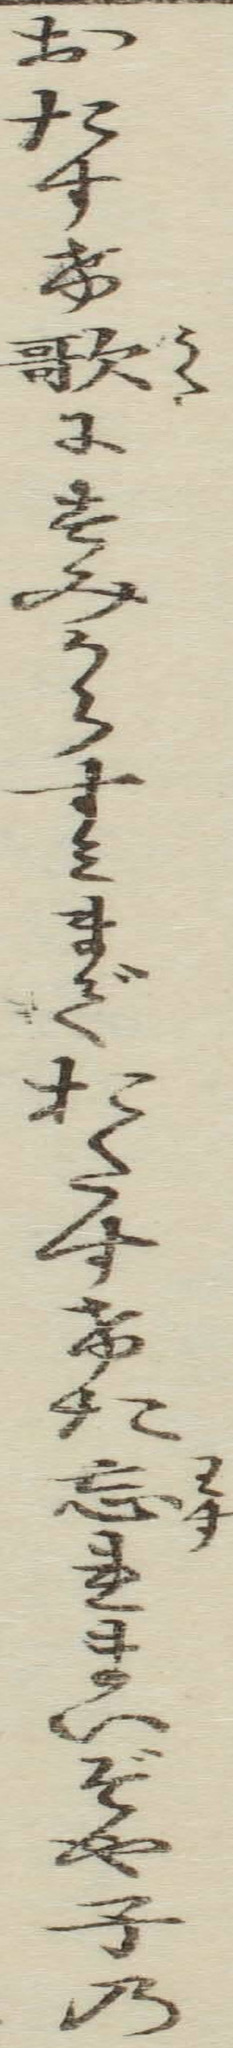おたすけ歌にすみからすみまでおたすけた忘れまいぞや子の
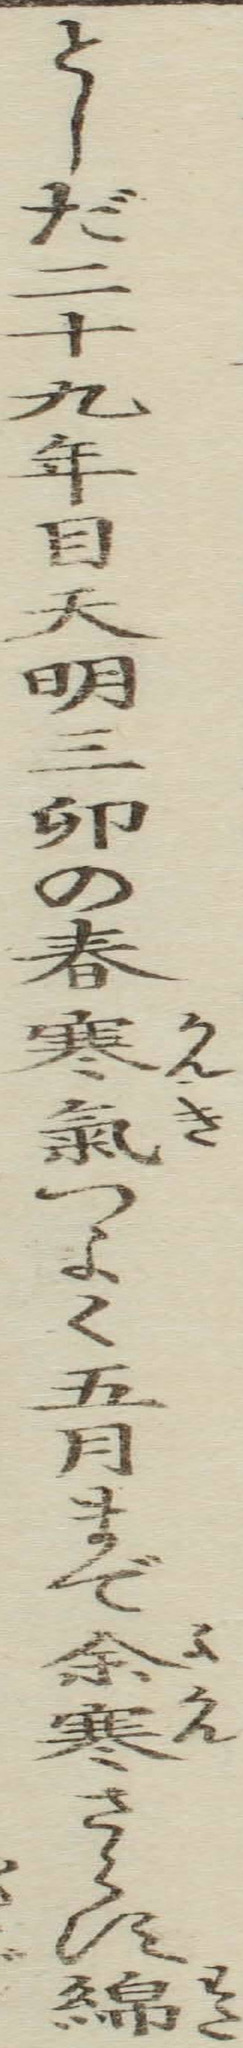としだ二十九年目天明三卯の春寒気つよく五月まで余寒さらす綿
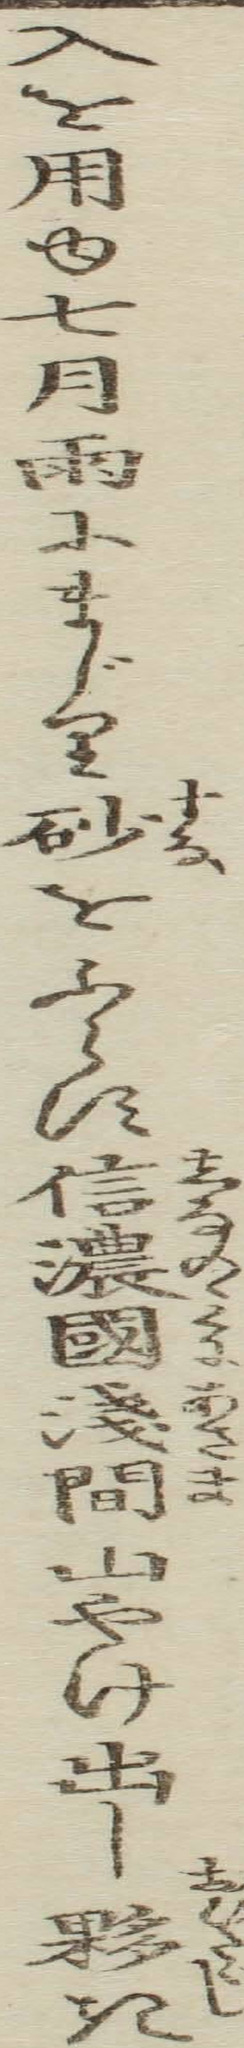入を用ゆ七月雨にまじり砂をふらす信濃国浅間山やけ出し夥き

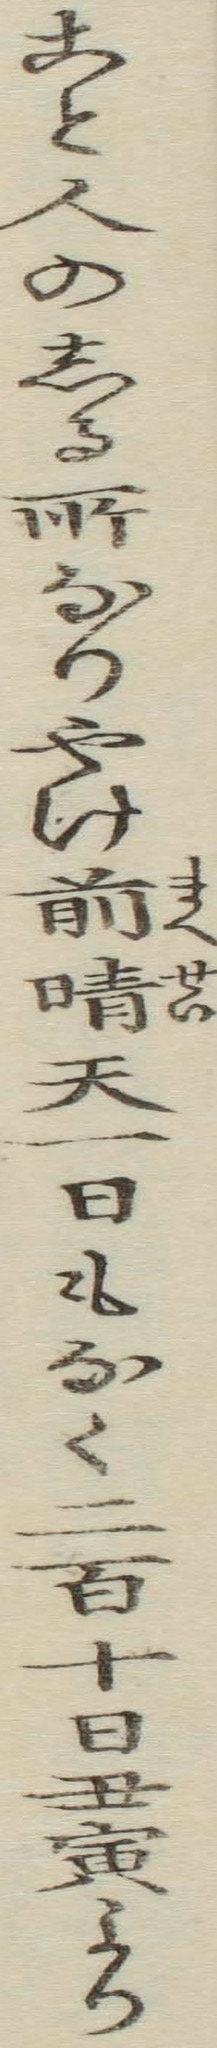こと人のしる所なりやけ前晴天一日もなく二百十日丑寅より
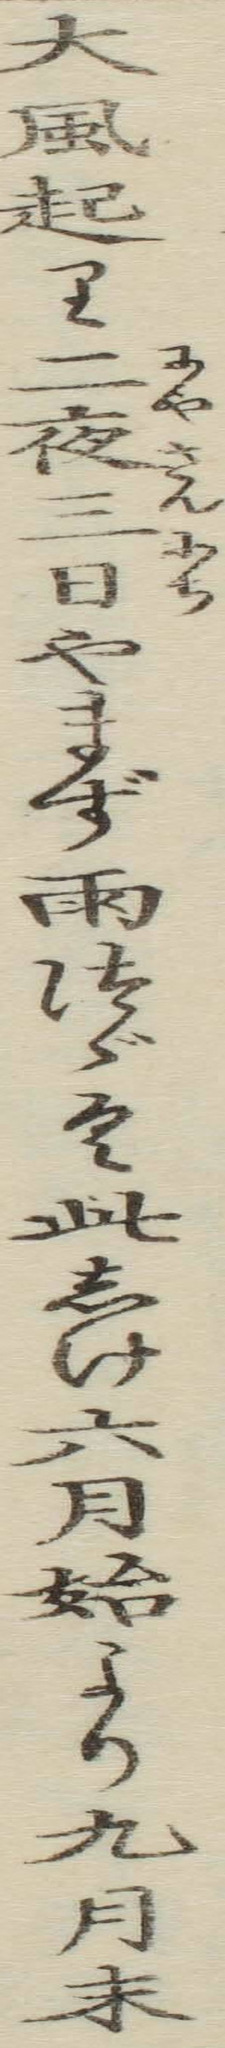大風起り二夜三日やまず雨つゞく此しけ六月始より九月末
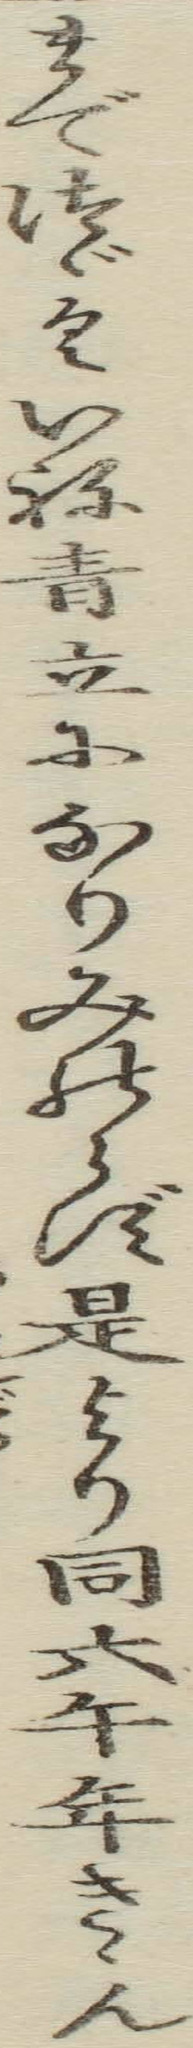までつゞくいね青立になりみのらず是より同六午年きゝん
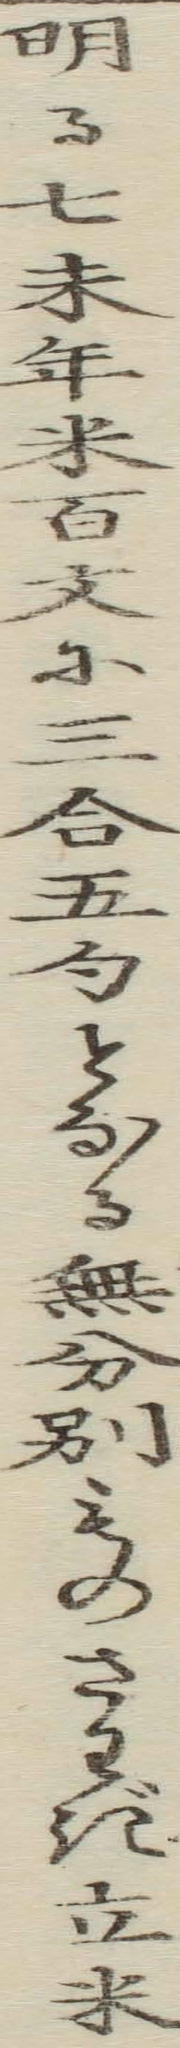明る七未年米百文に三合五勺となる無分別ものさわぎ立米
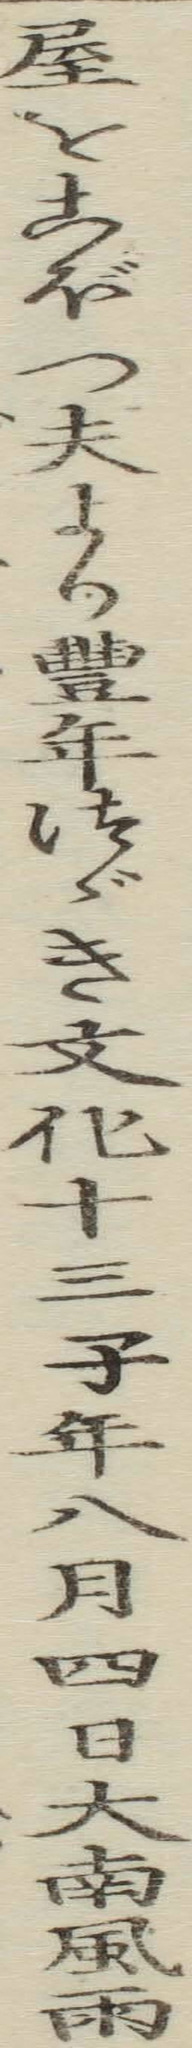屋をこぼつ夫より豊年つゞき文化十三子年八月四日大南風雨
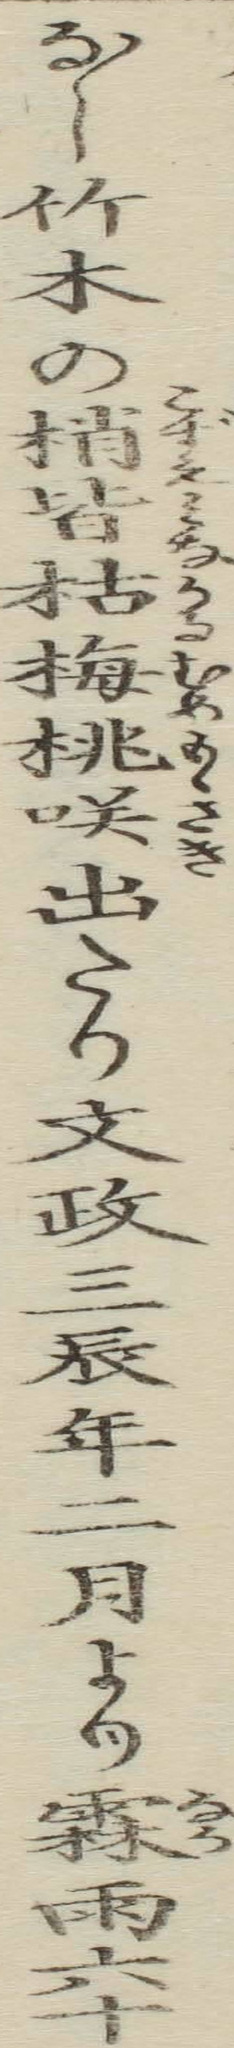なし竹木の梢皆枯梅桃咲出たり文政三辰年二月より霖雨六十
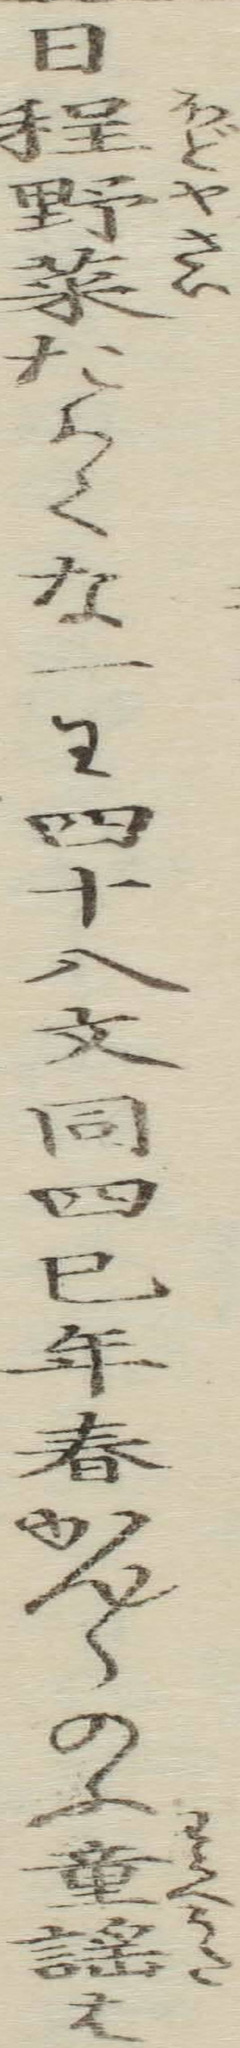日程野菜たかくな一わ四十八文同四巳年春かん〳〵のふ童謡は
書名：救荒便覧
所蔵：国文学研究資料館
